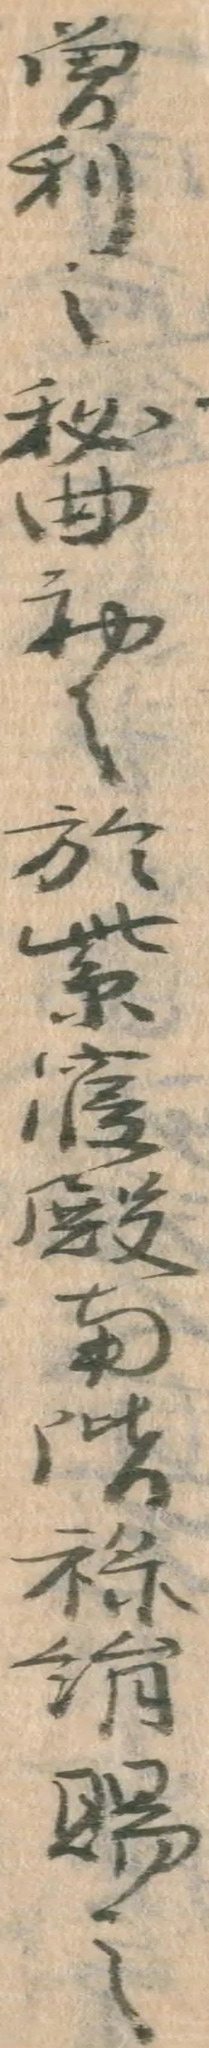曽利之秘曲勤之、於紫宸殿南階禄絹賜之、
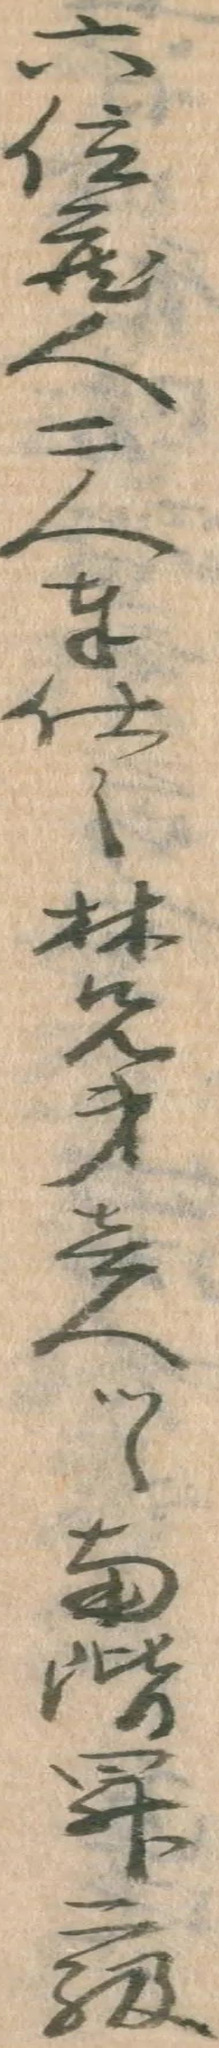六位蔵人二人奉仕也、林兄弟壱人ツヽ南階昇二級、
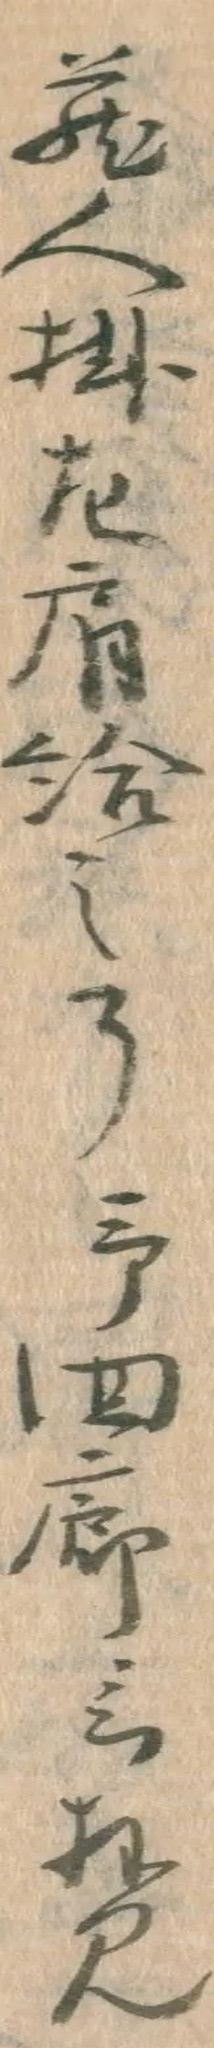蔵人掛左肩給之了、回廊ニ而披見、
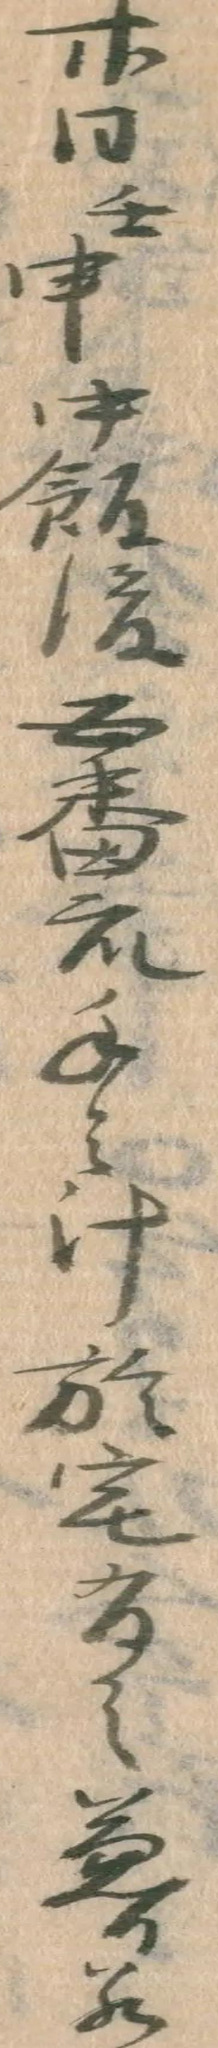廿日壬申、中飯後五番衆手之汁、於宅有之、兼而若
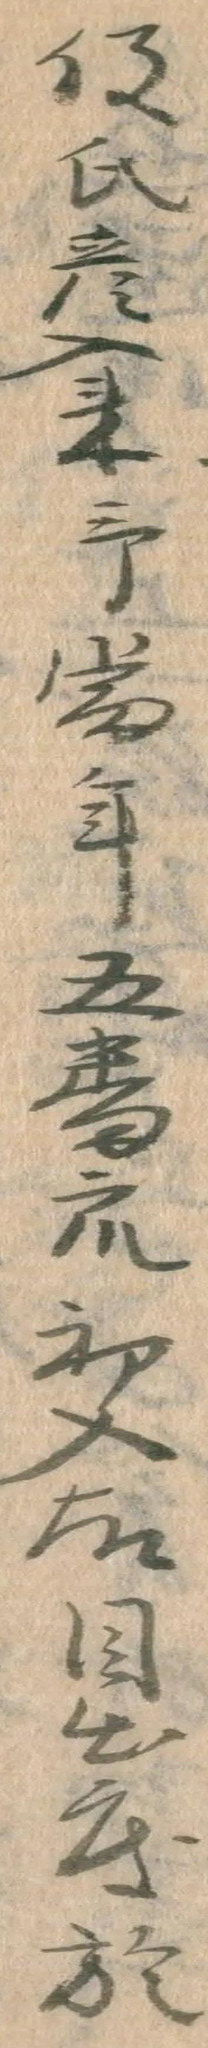役氏彦入来、予當年五番衆初入故、目出度於
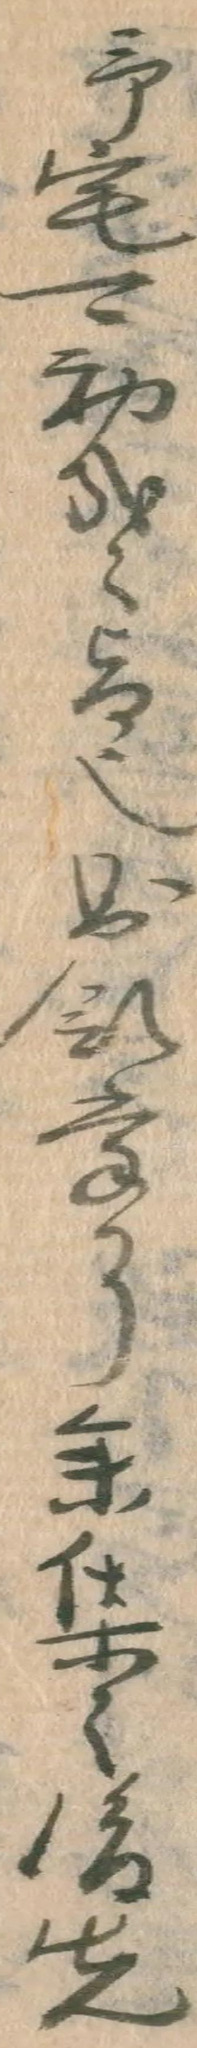予宅可勤哉々旨也、則領掌了、参集之後、先
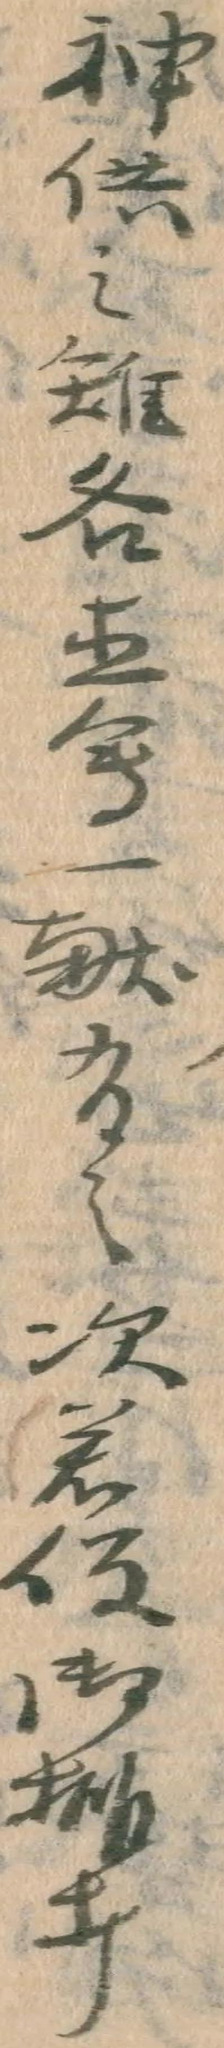神供之雉各直會一献有之、次若役御掛打
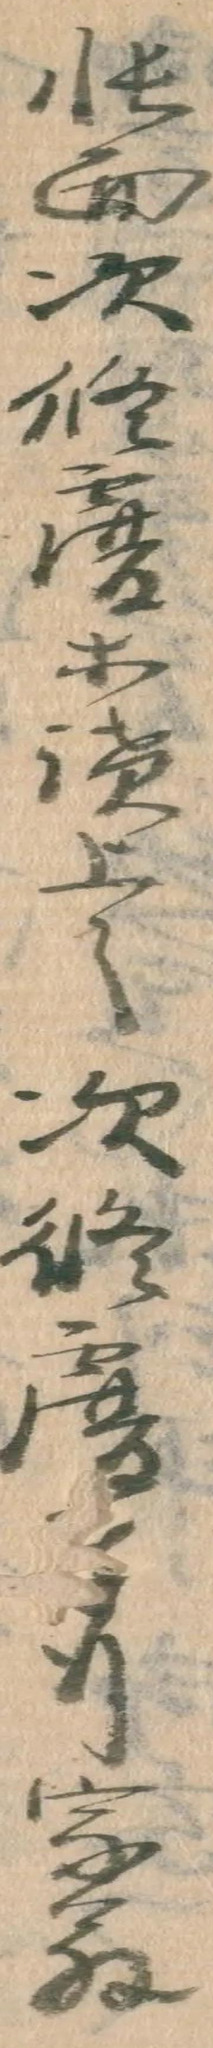帳面、次修覆等読上了、次修復奉行家翁
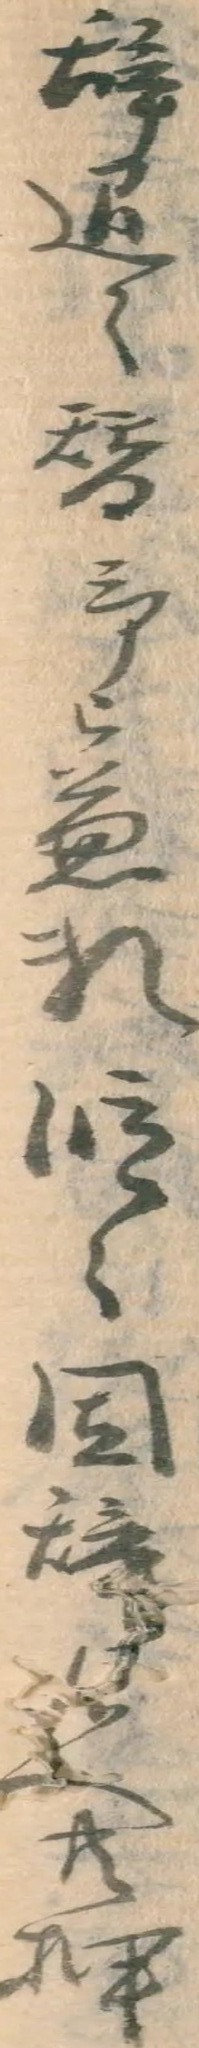辞退之、替予被兼頼、段々固辞退候へ共、押
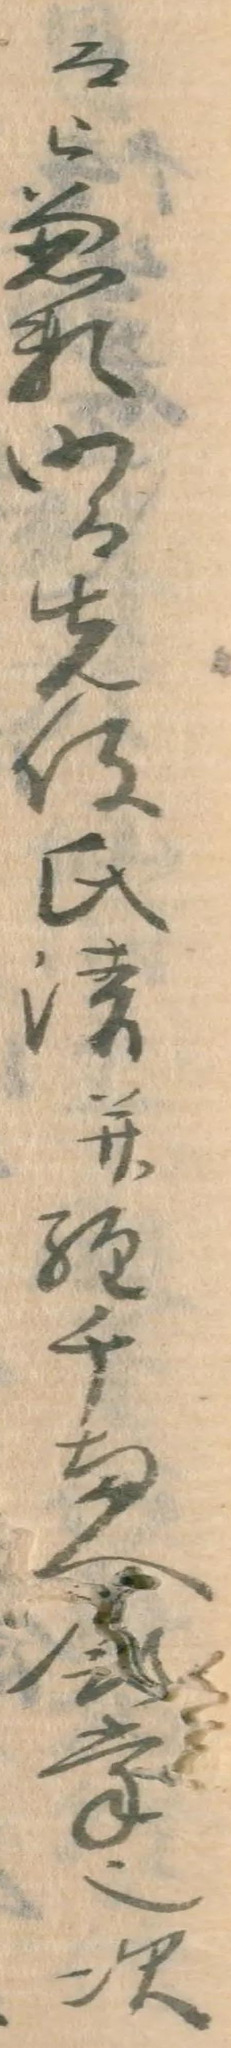而被兼頼、仍而先役氏清幷経千両人領掌也、次
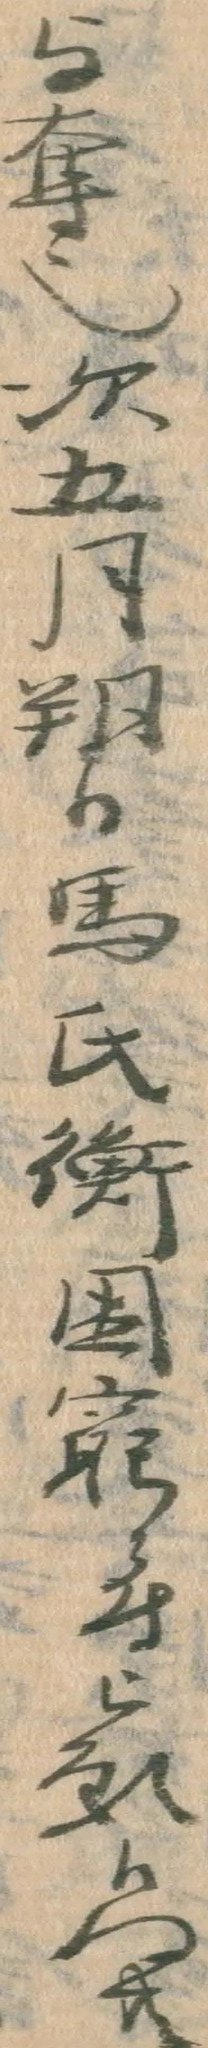与奪也、次五月朔日馬、氏衡困窮ニ付被願候得共
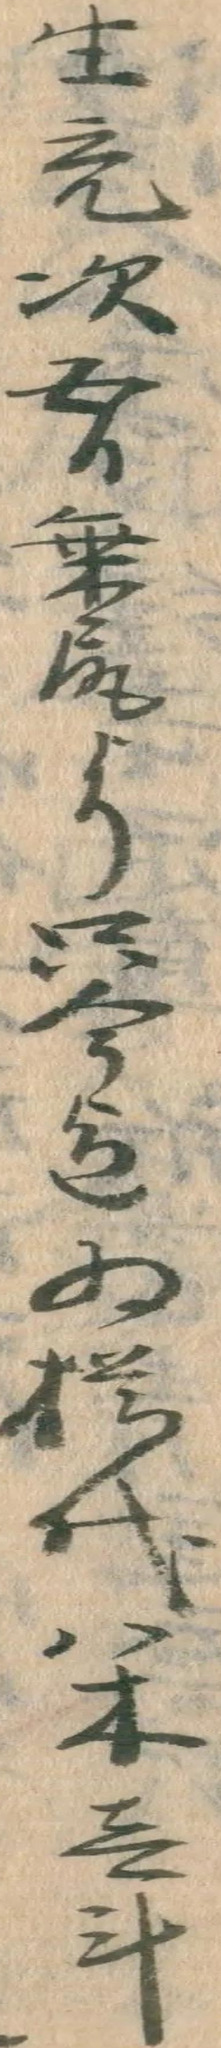生充、次五日乗尻より、只今迄為樽代米壱斗
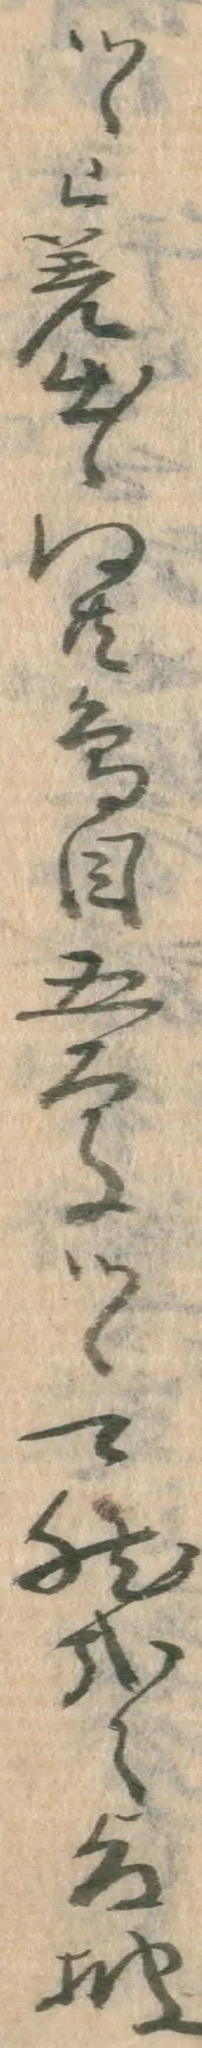ツヽ被差出候得共、鳥目五百文ツヽ可然哉之旨披
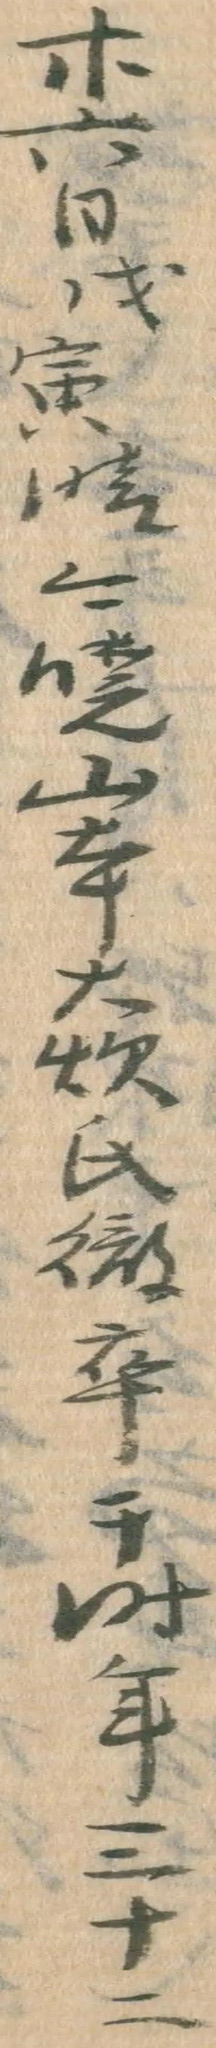廿六日戊寅晴、今暁山本大炊氏徹卒、于時年三十二、
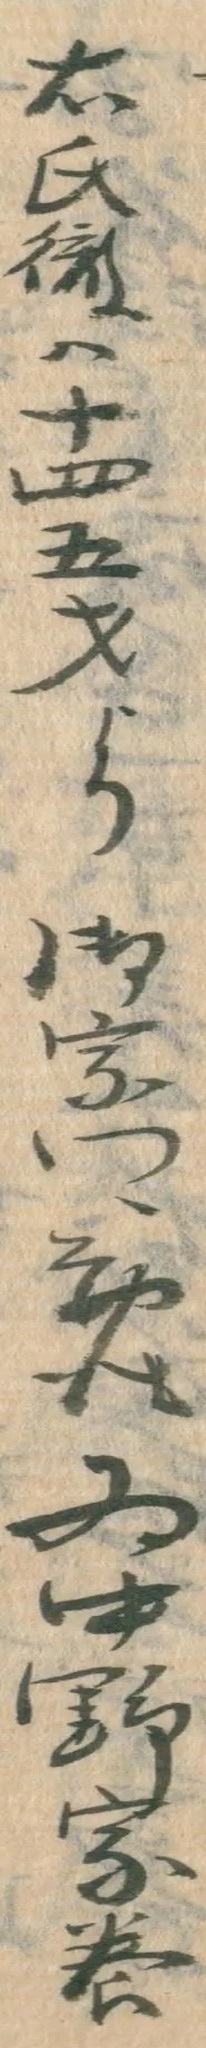右氏徹ハ十四・五才より御家門へ勤仕、為中野家養
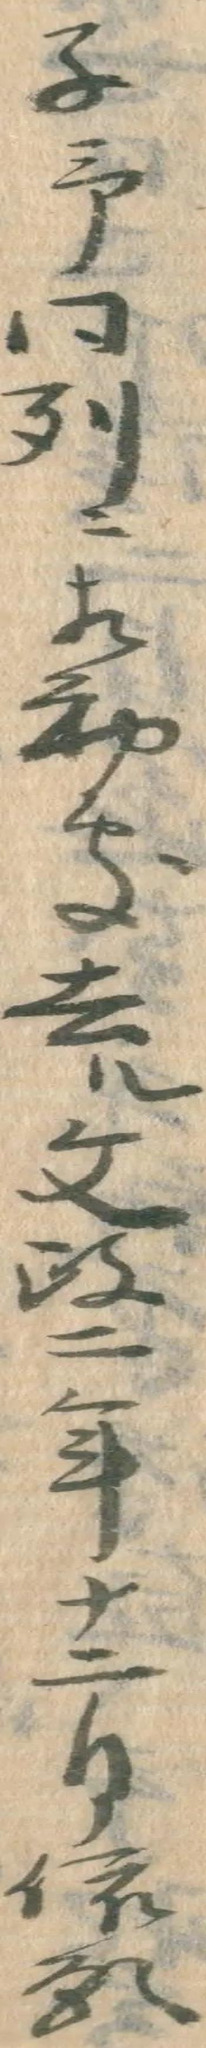子、予同列に相勤處、去ル文政二年十二月依願
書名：賀茂社記録. 第63冊
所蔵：国立国会図書館 National Diet Library, JAPAN
